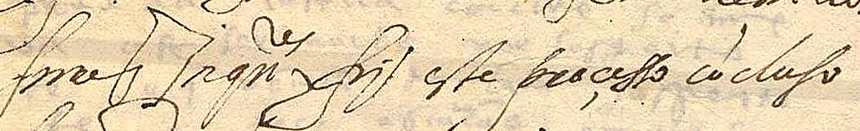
snres̄ Jnqures fiz este processo cōcluso
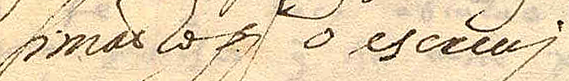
simaõ lopz̄ o escreuj
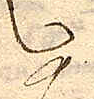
ꝯo
